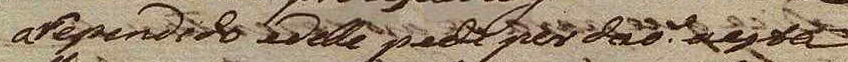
arependido, e delle pede perdaõ a esta
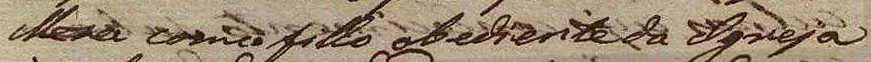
Meza como filho obediente da Igreja
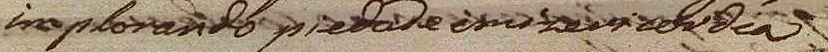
implorando piedade, e mizericordia
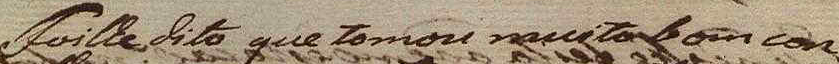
Foilhe dito que tomou muito bom con
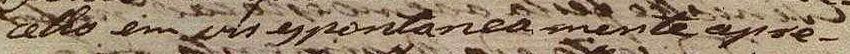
celho em vir espontaneamente apre
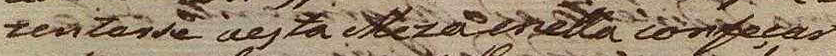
zentarse a esta Meza, e nella confeçar
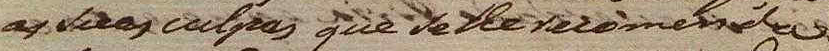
as suas culpas que se lhe recomenda
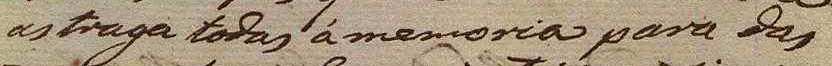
as traga todas á memoria para das
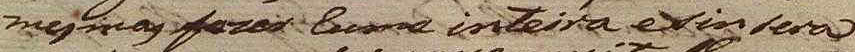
mesmas fazer huma inteira, e sinsera
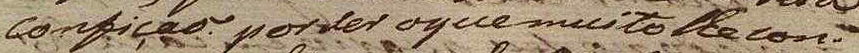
confiçaõ por ser o que muito lhe con
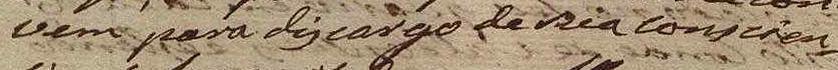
vem para descargo de sua conscien
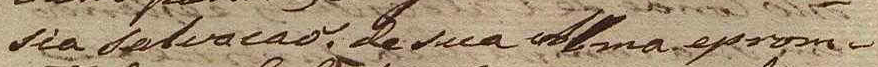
sia salvaçaõ de sua alma e prome
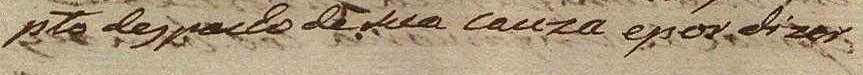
pto despacho de sua cauza e por dizer
